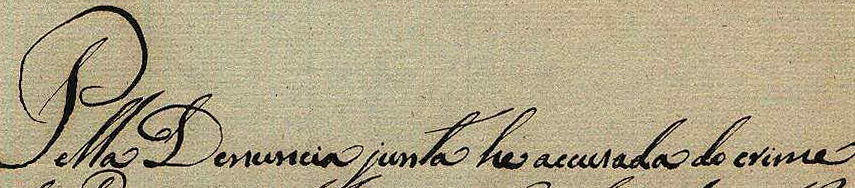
Pella Denuncia junta he accusada do crime
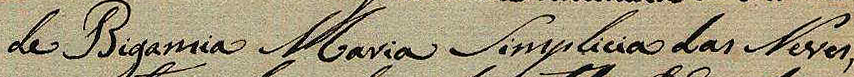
de Bigamia Maria Simplicia das Neves,
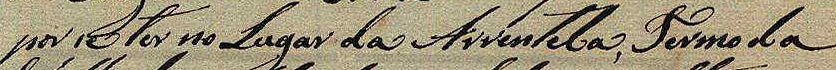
por se ter no Lugar da Arrentela, Termo da
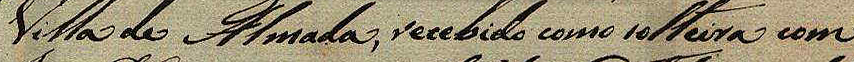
Villa de Almada, recebido como solteira com
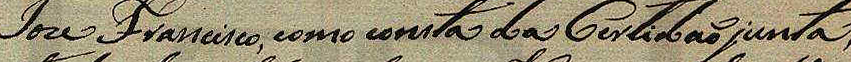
Ioze Francisco, como consta da Certidaõ junta,
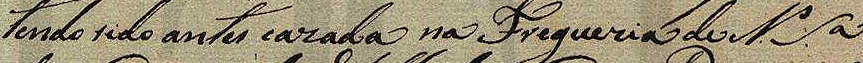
tendo sido antes cazada na Freguezia de N. S.a
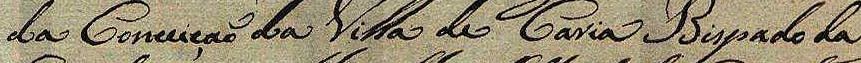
da Conceição da Villa de Caria Bispado da
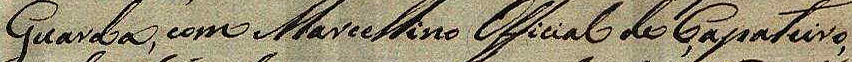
Guarda, com Marcellino Official de Çapateiro,
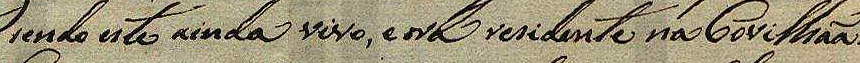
sendo este ainda vivo, e ora residente na Covilhaã.
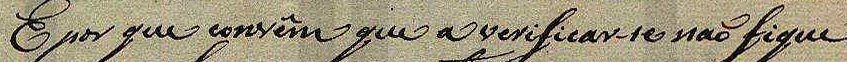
E por que convêm que a verificar-se naõ fique
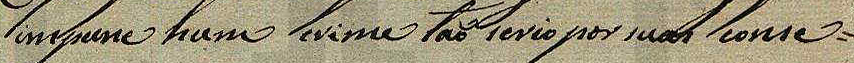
impune hum crime taõ serio por suas conse
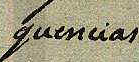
quencias
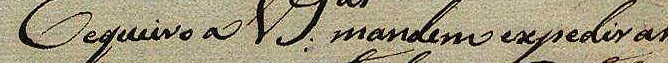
Requeiro a V S.as mandem expedir as
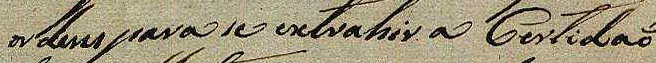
ordens para se extrahir a Certidaõ
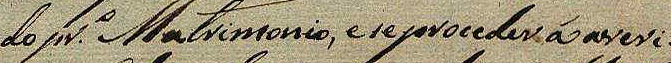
do pr.o Matrimonio, e se proceder á averi
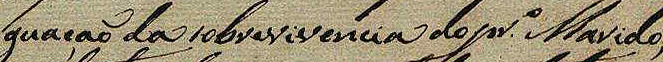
guaçaõ da sobrevivência do pr.o Marido,
